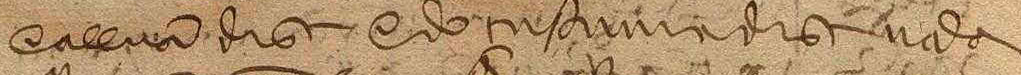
e all nā dise e do custume dise nada
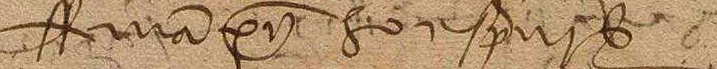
ffernā p̄iz ho esp̄uj
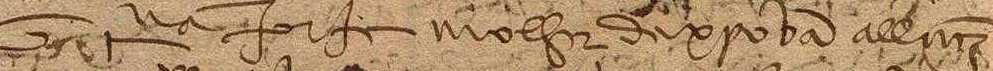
item cna JorJe molher de xpovā alluēz
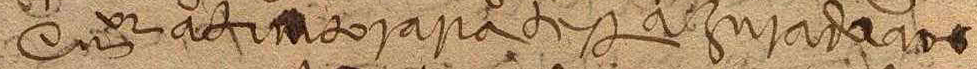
e mor a timtoraria testa Jurada aos
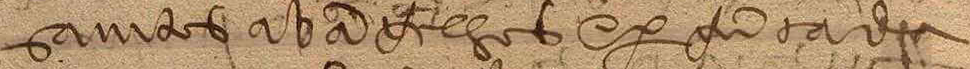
samtos avāgelhos e ꝑgūtada
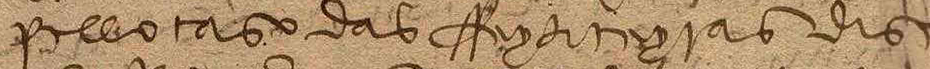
pello caso das ffeyticeyras dise
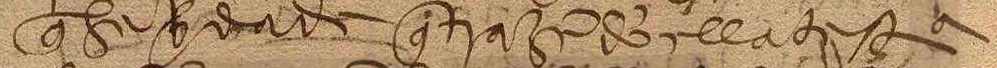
q̄ he ꝟdade q̄ trazēdo ella testa
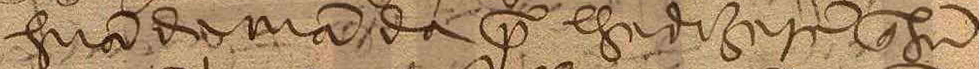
huā demāda p̄o lhe dizerē q̄ hū
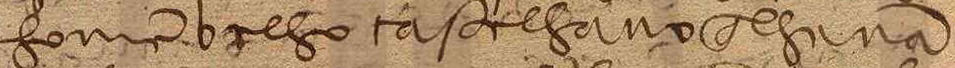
homē velho castelhano q̄ lhe nā
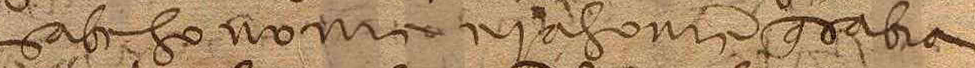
sabe o nome era homē q̄ sabia
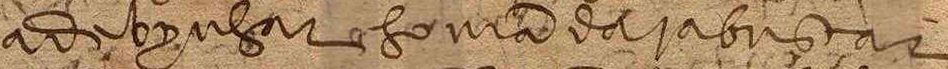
adevynhar ho mādara buscar
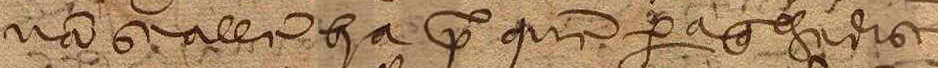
nā se allēbra p̄o quē ꝑa q̄ lhe dise
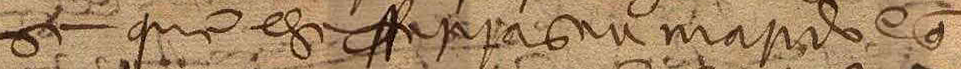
se quē lhe fferira seu marido e q̄
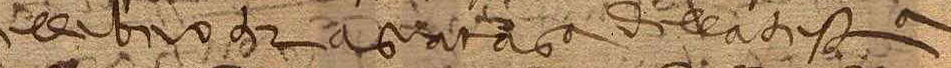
elle veo ter a sua casa dela testa
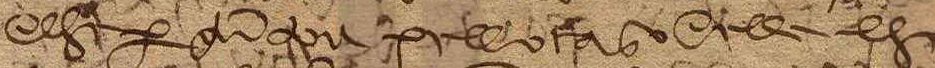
e lhe ꝑgūtou pello caso e elle lhe
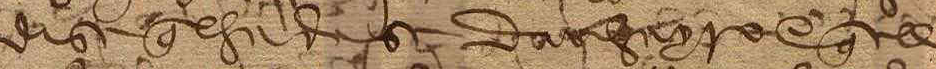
dise q̄ lhe dese dinheyro e q̄ elle
